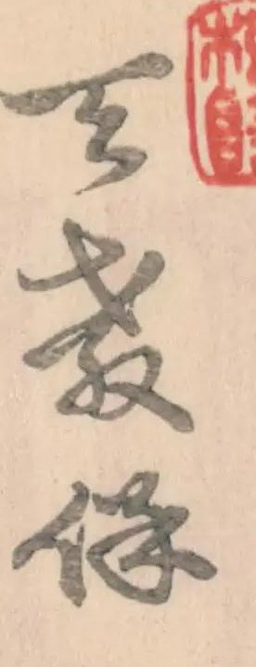天教保

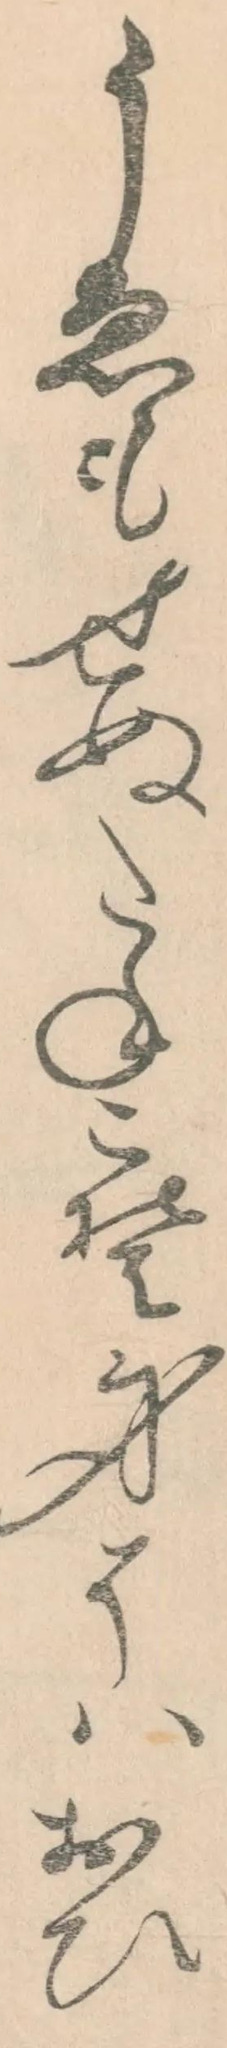うゑもせぬたねこそ身にはおひ
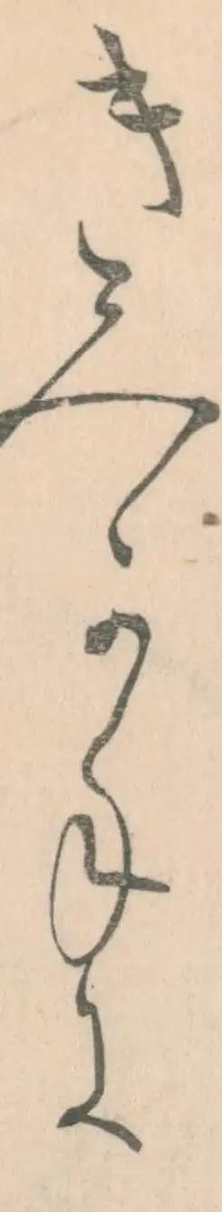きみか手に
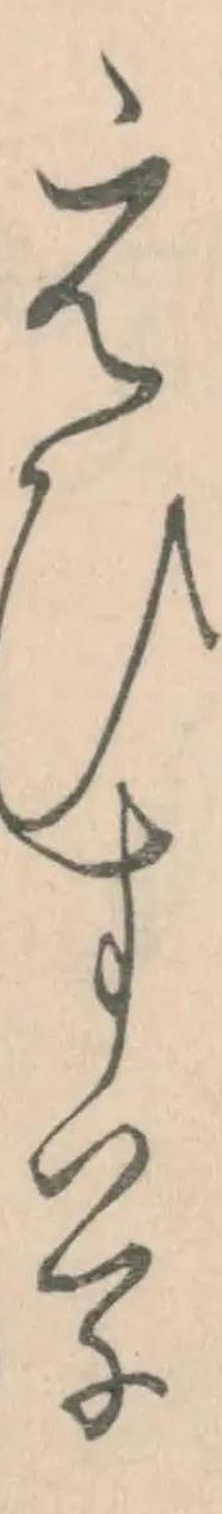えひす草
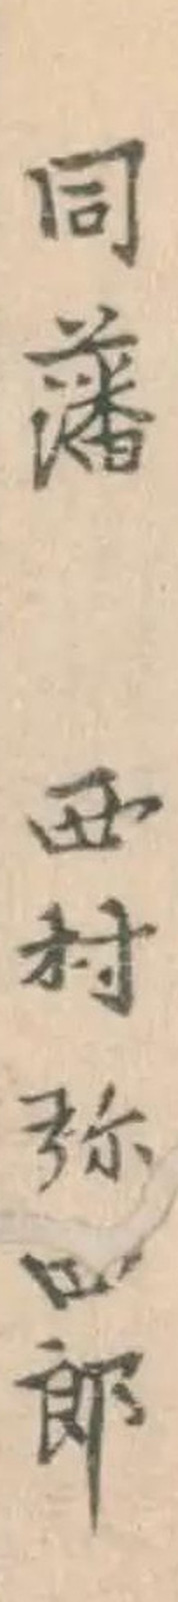同藩西村弥四郎
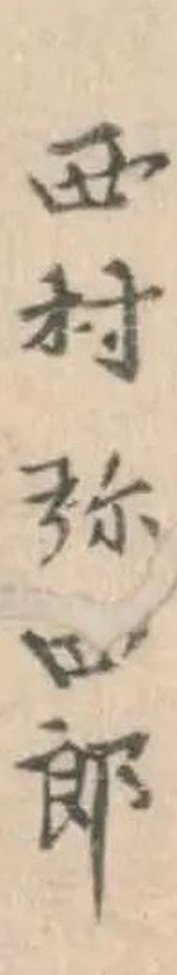同藩西村弥四郎
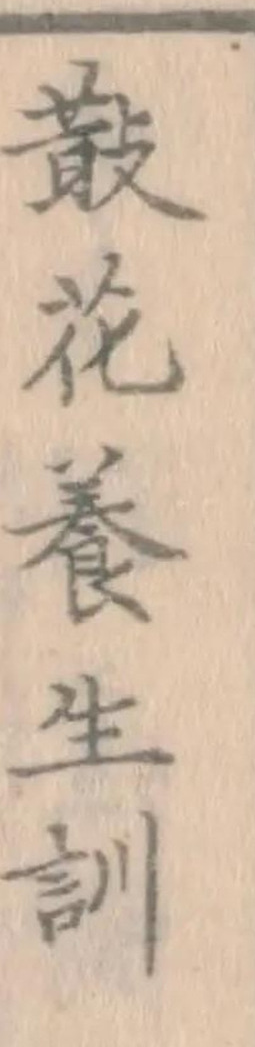散花養生訓
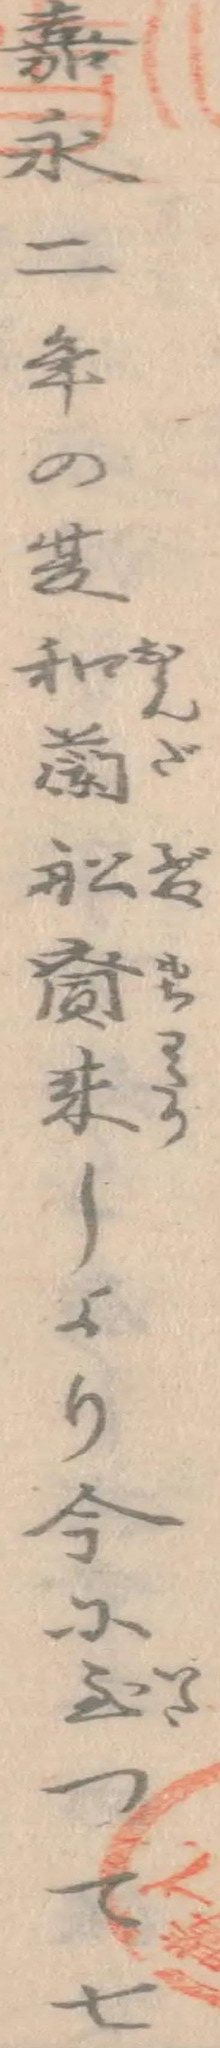嘉永二年の夏和蘭船齎来しより今に至つて七
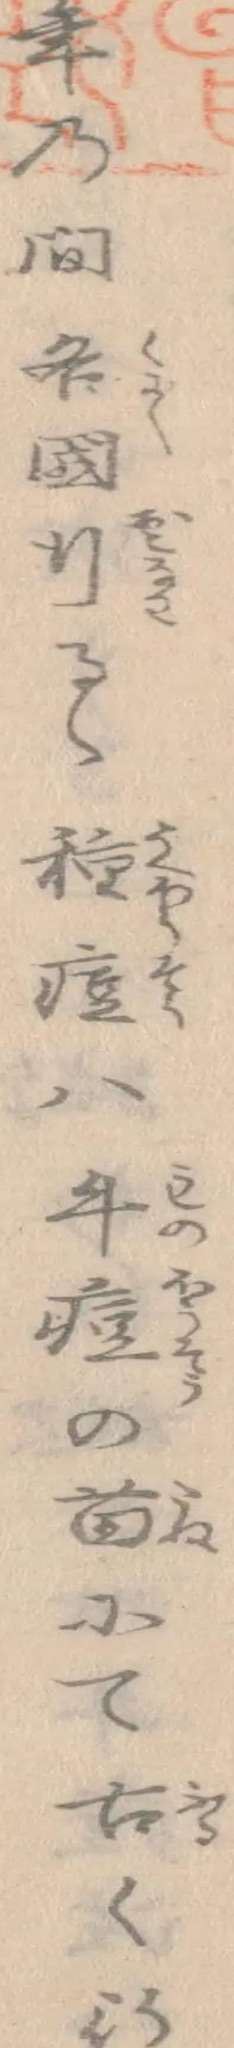年の間各国行るゝ種痘は牛痘の苗にて古く行
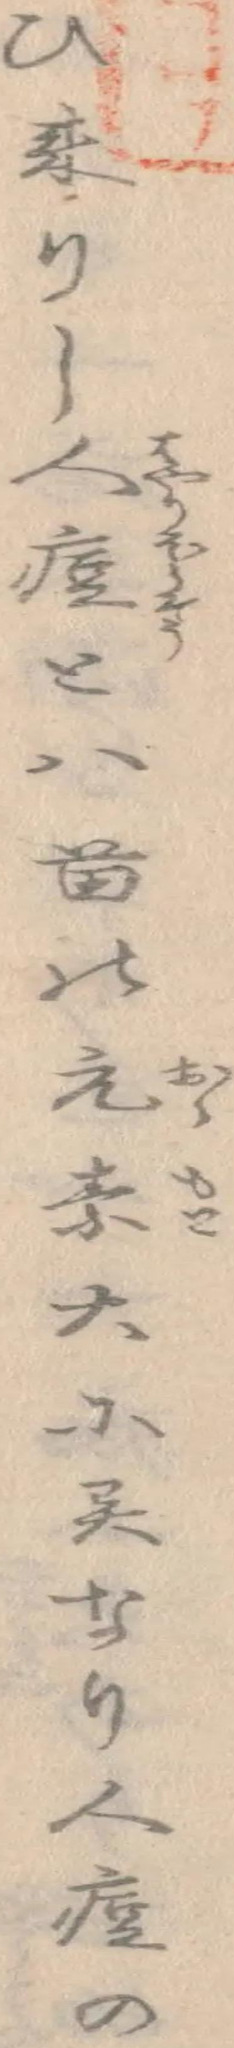ひ来りし人痘とは苗の元素大に異なり人痘の
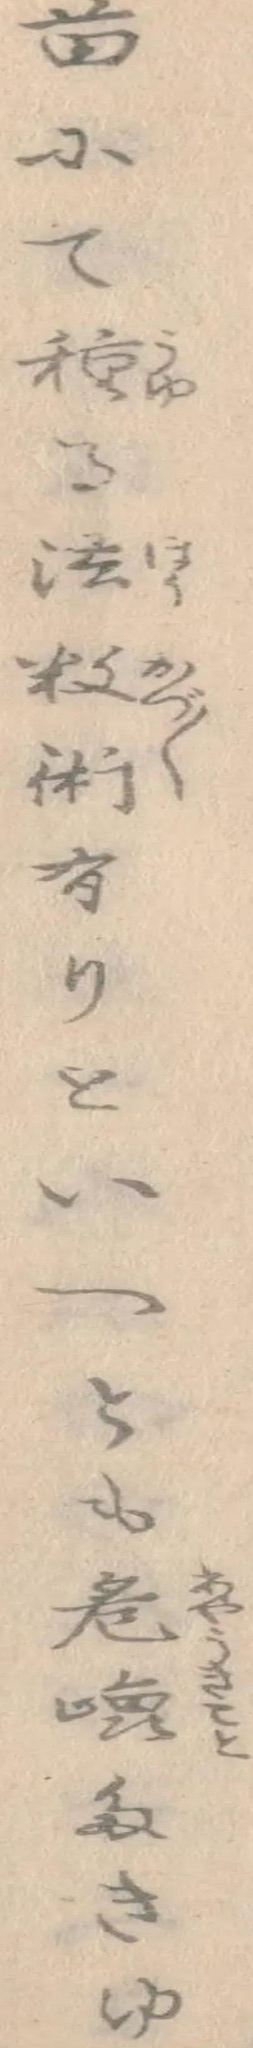苗にて種る法数術有りといへとも危嶮多きゆ
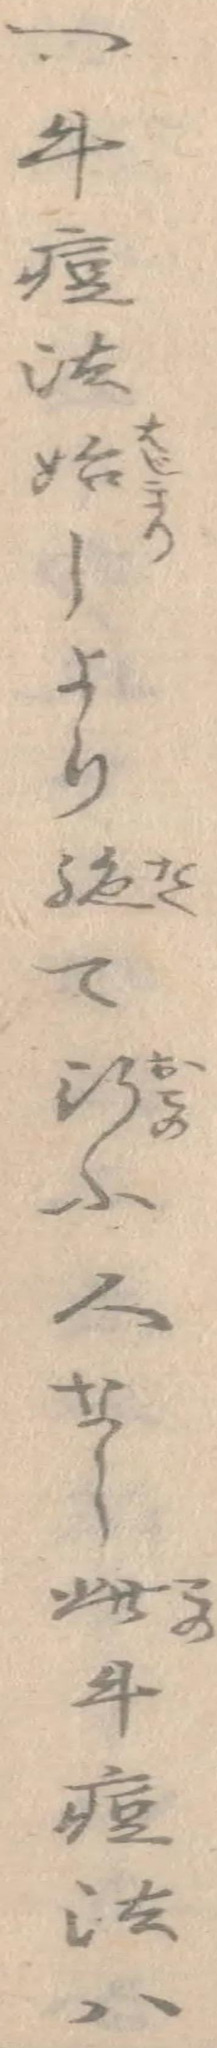へ牛痘法始しより絶て行ふ人なし此牛痘法は
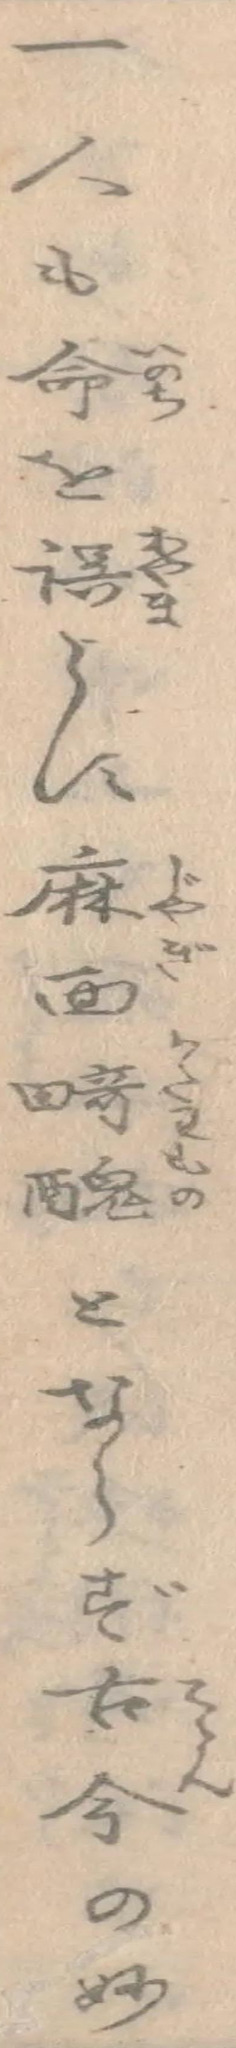一人も命を誤らす麻面畸醜とならず古今の妙

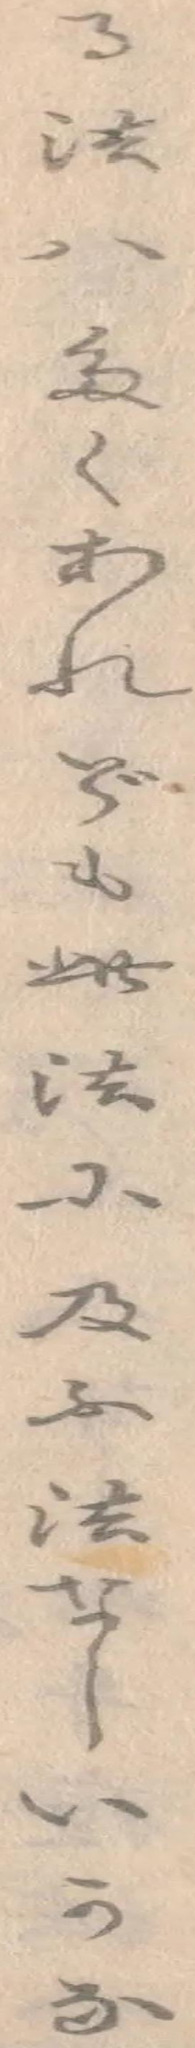る法は多くあれども此法に及ふ法なしいかな
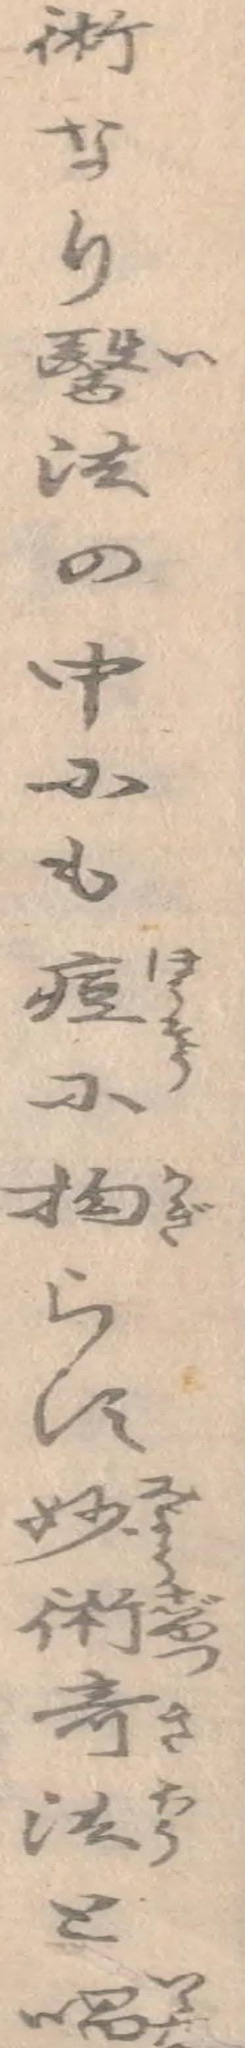術なり医法の中にも痘に鈎らす妙術奇法と唱
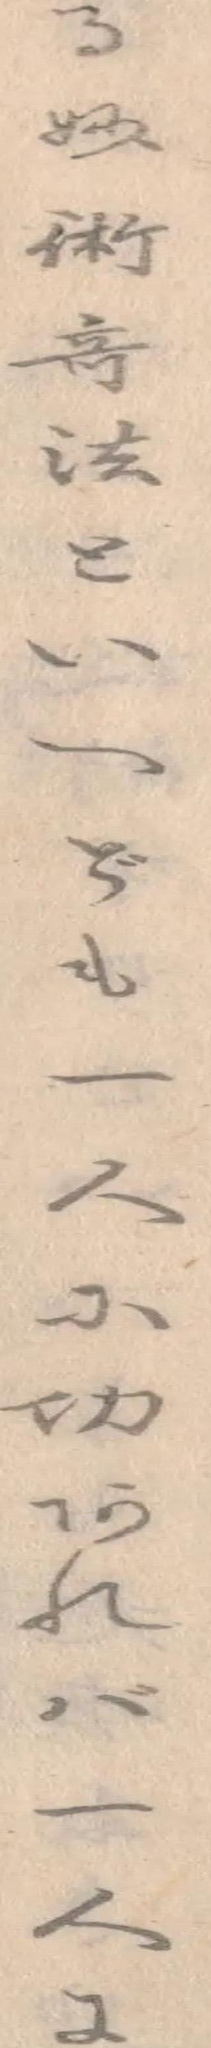る妙術奇法といへども一人に功あれば一人に
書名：散花養生訓
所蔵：国立国会図書館 National Diet Library, JAPAN
